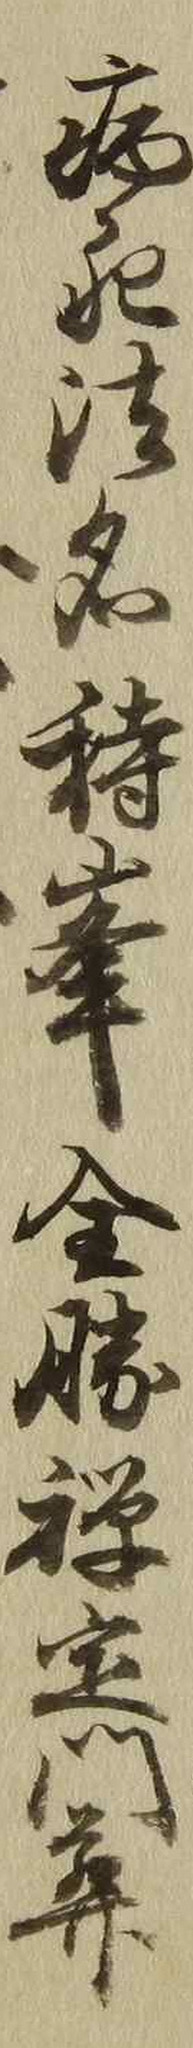病死法名特峯全勝禅定門葬
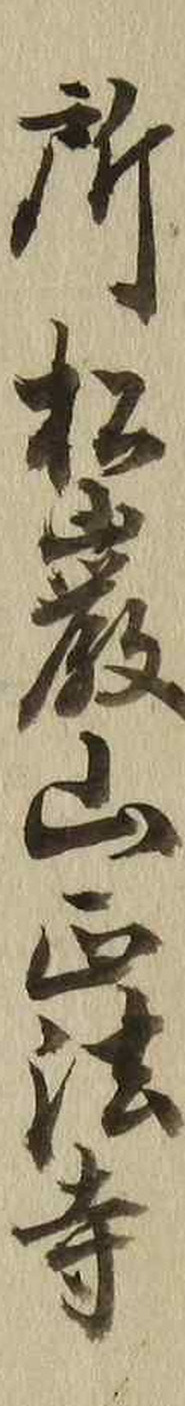所松厳山正法寺
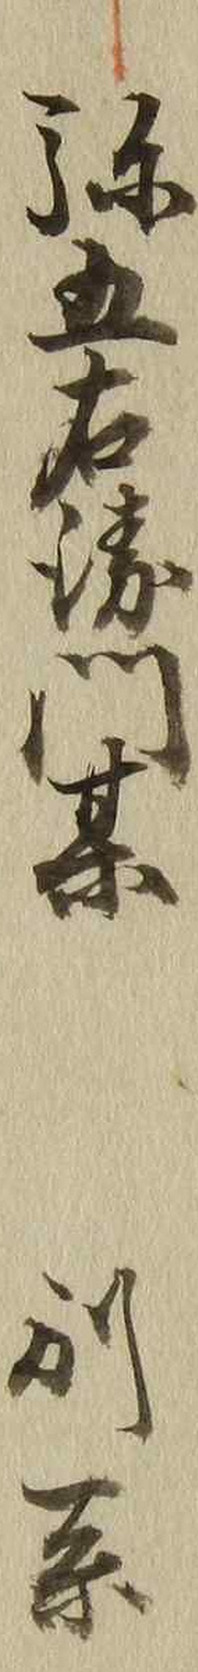弥五右衛門某別系
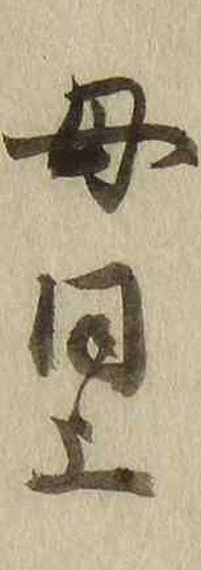母同上
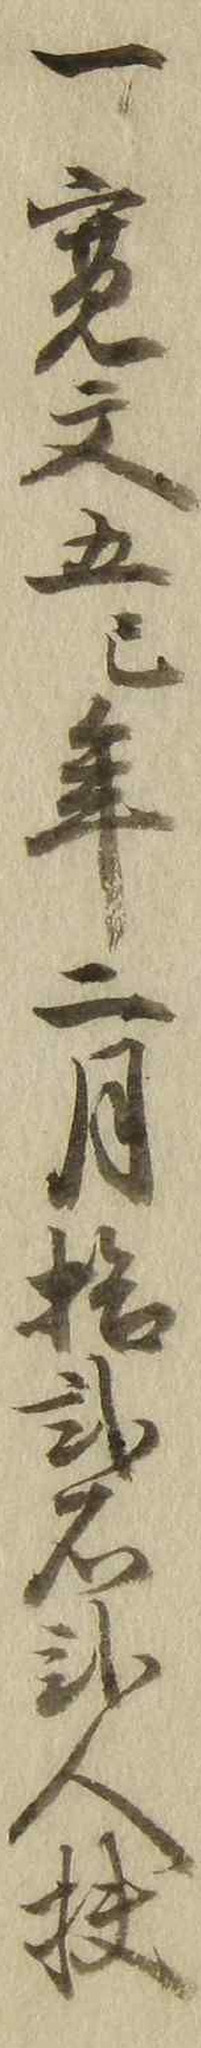一寛文五巳年二月拾弐石弐人扶

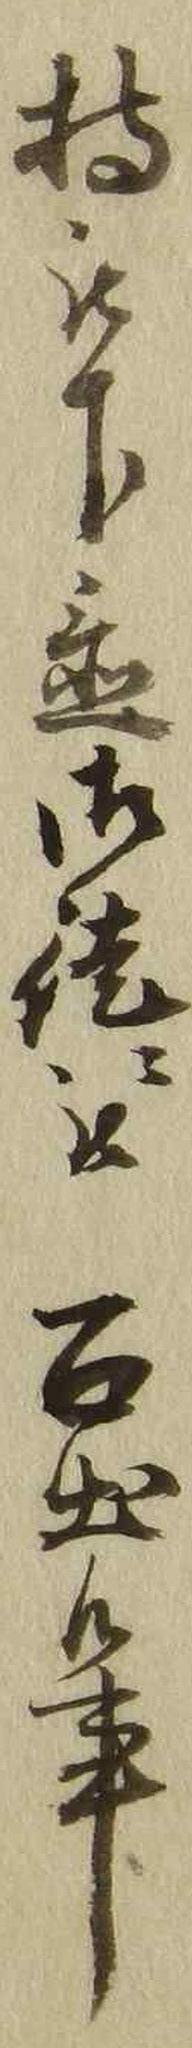持被下置御徒ニ被召出候事
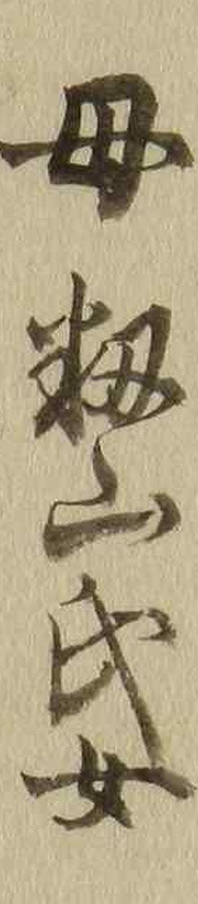母籾山氏女
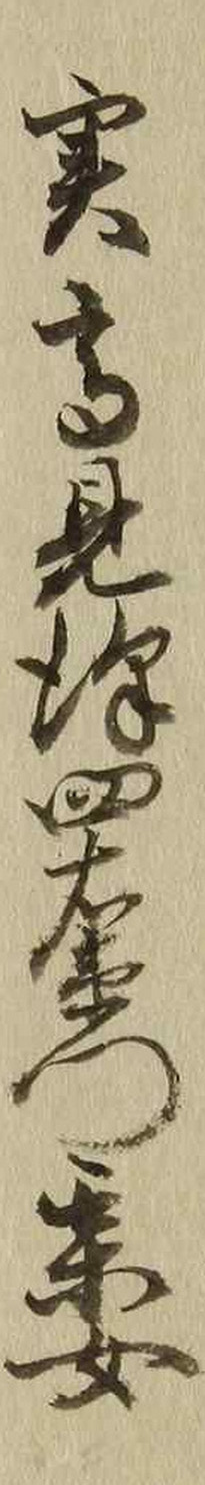実高見澤四右衛門采女
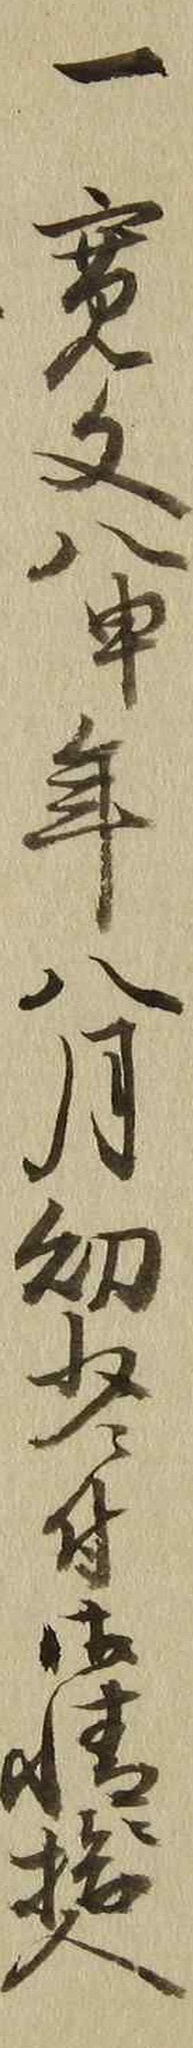一寛文八申年八月幼少ニ付オナサニ拾人
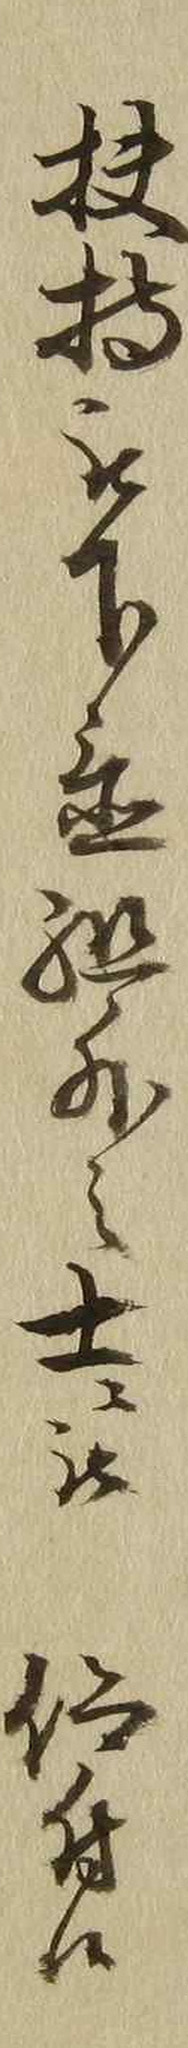扶持被下置組外之士ニ被仰付候
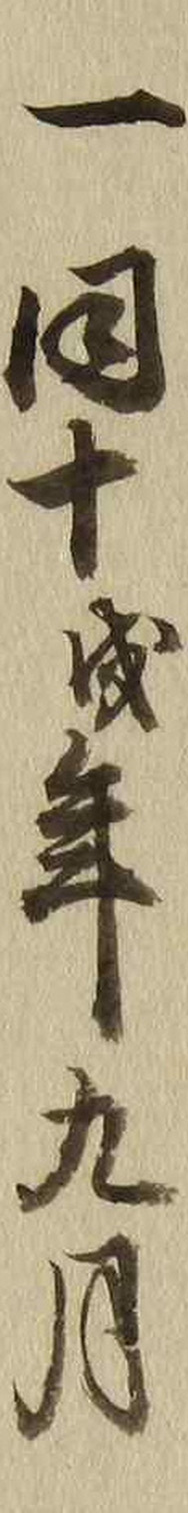一同十戌年九月
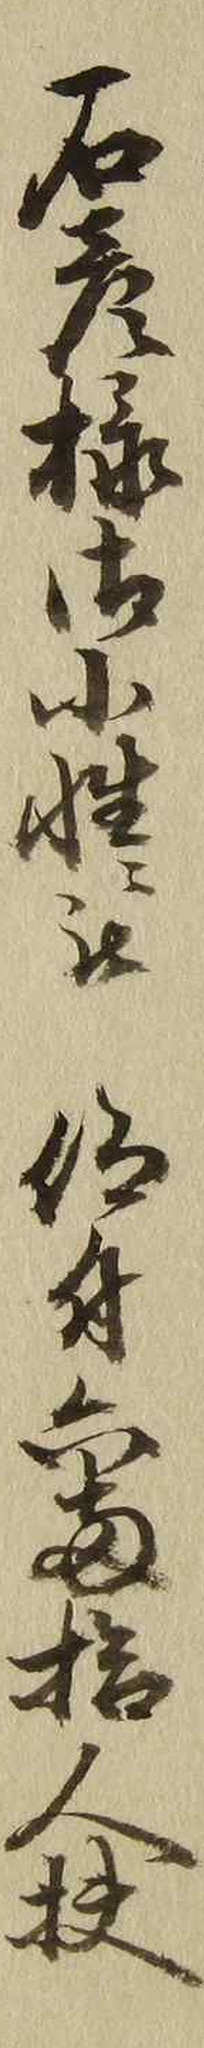石彦様御小姓ニ被仰付六両ｚ拾人扶
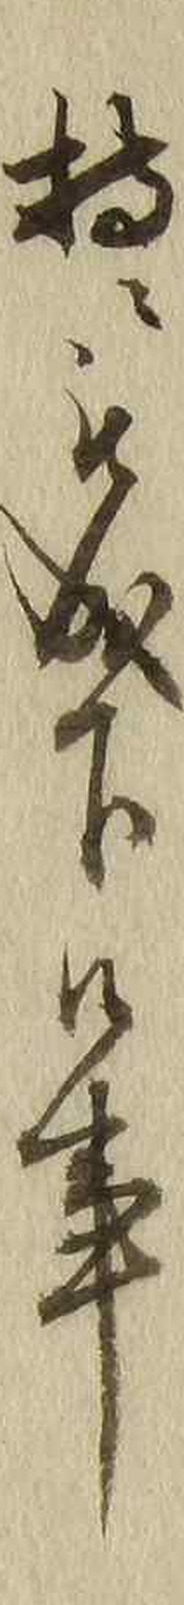持ニ被成下候事
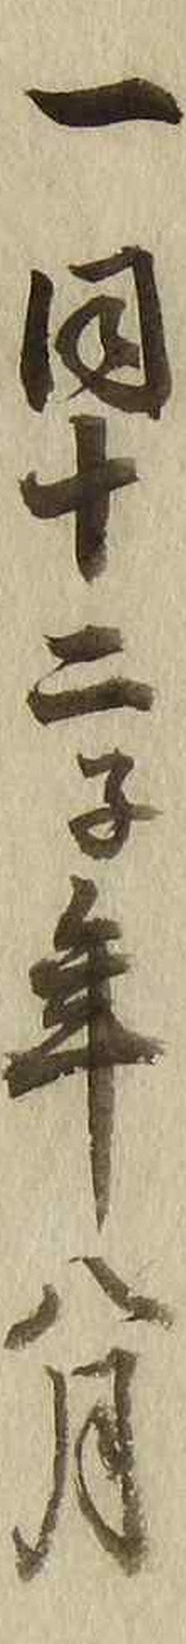一同十二子年八月
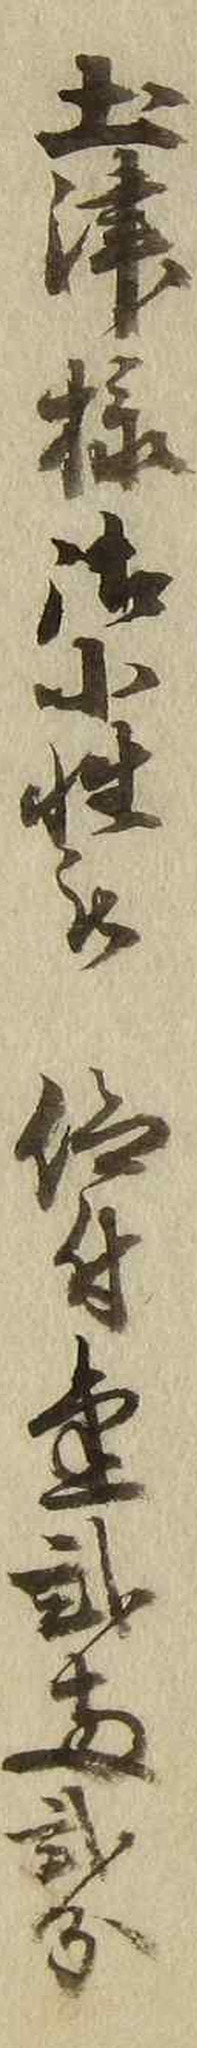土津様御小姓被仰付金弐両弐分
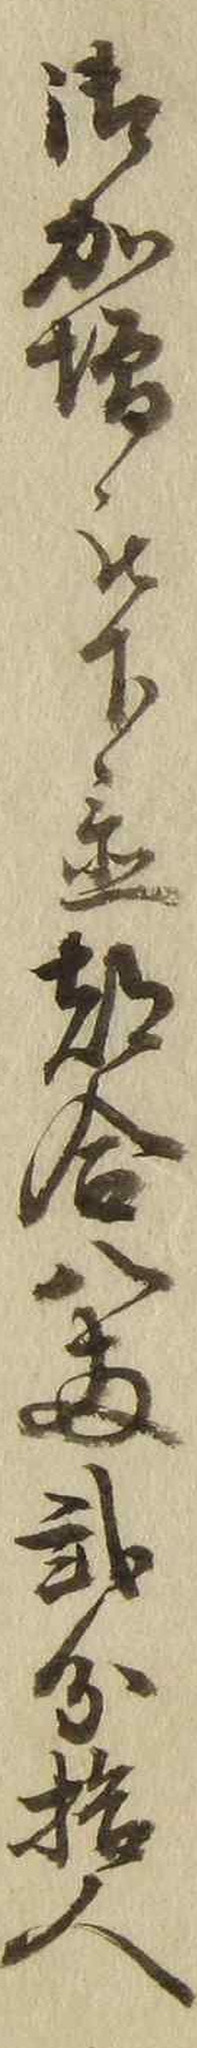御加増被下置都合八両弐分拾人
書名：諸士系譜　巻之64　と之部7
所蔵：会津若松市立会津図書館
